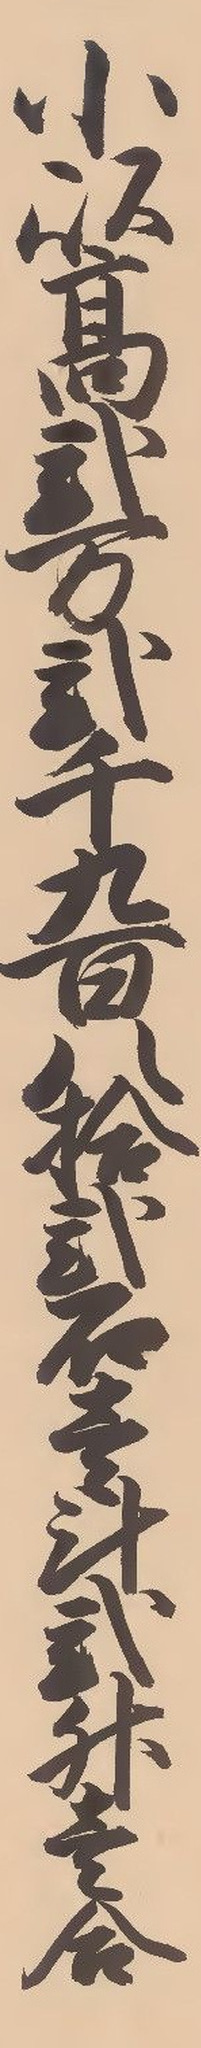小以高弐万弐千九百八拾弐石壱斗弐升壱合

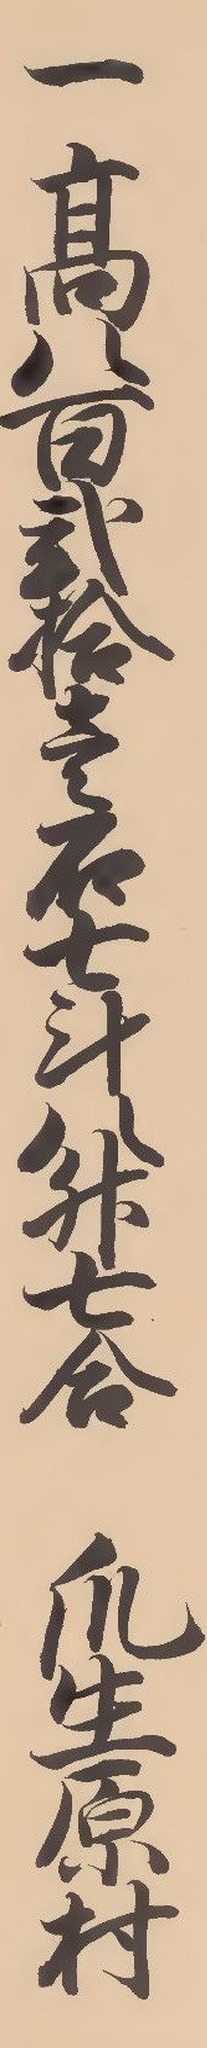一高八百弐拾壱石七斗八升七合爪生原村
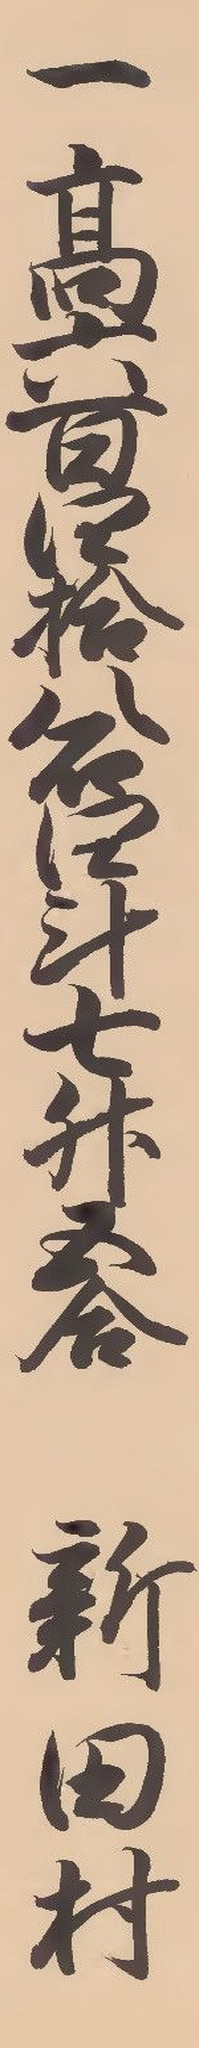一高六百四拾八石四斗七升五合新田村
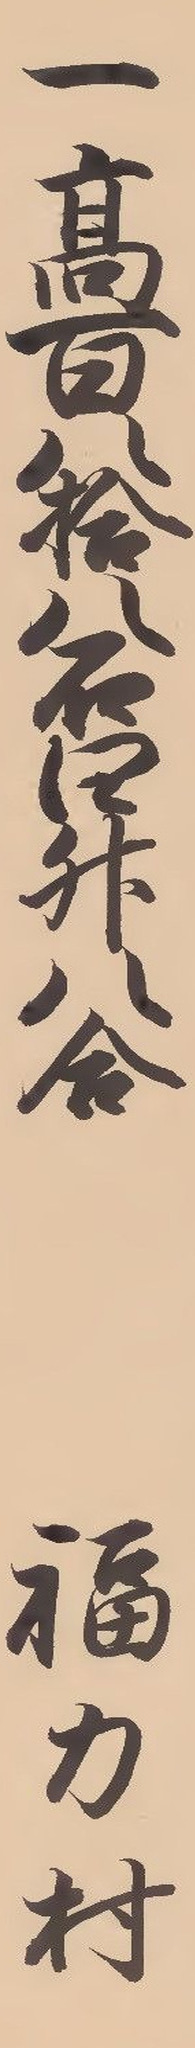一高百八拾八石四升八合福力村
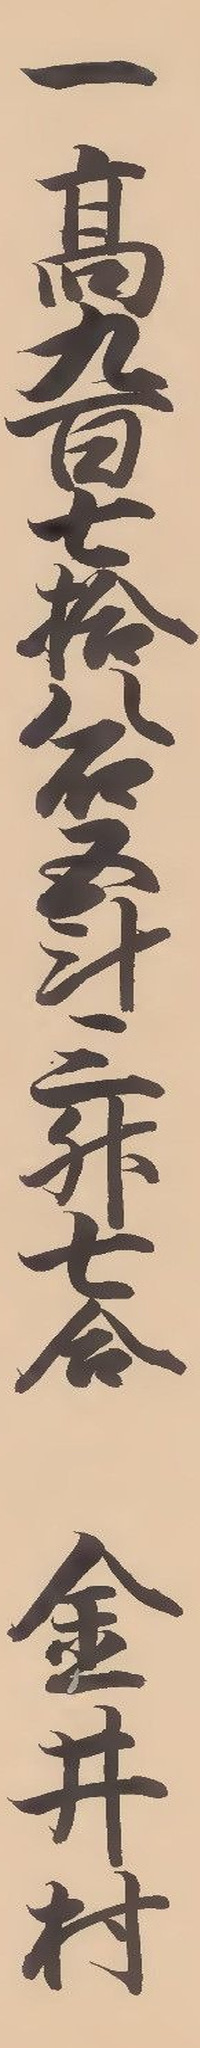一高九百七拾八石五斗三升七合金井村
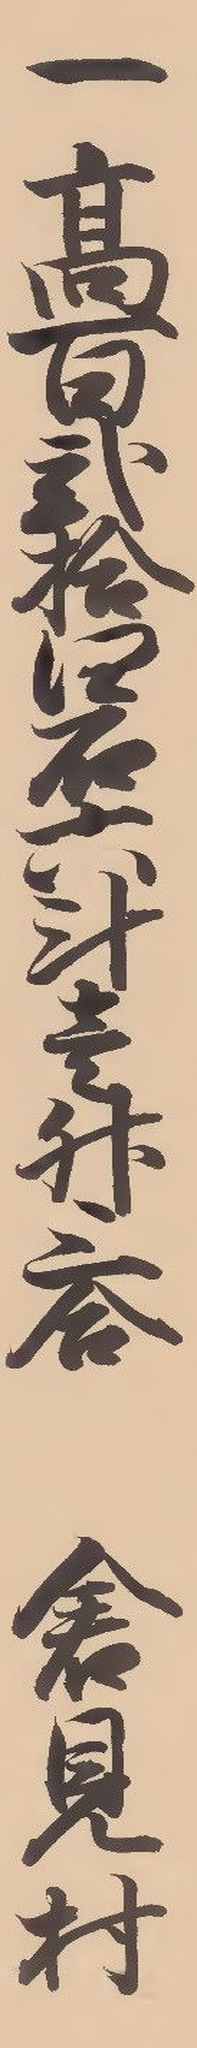一高百弐拾四石六斗壱升三合倉見村
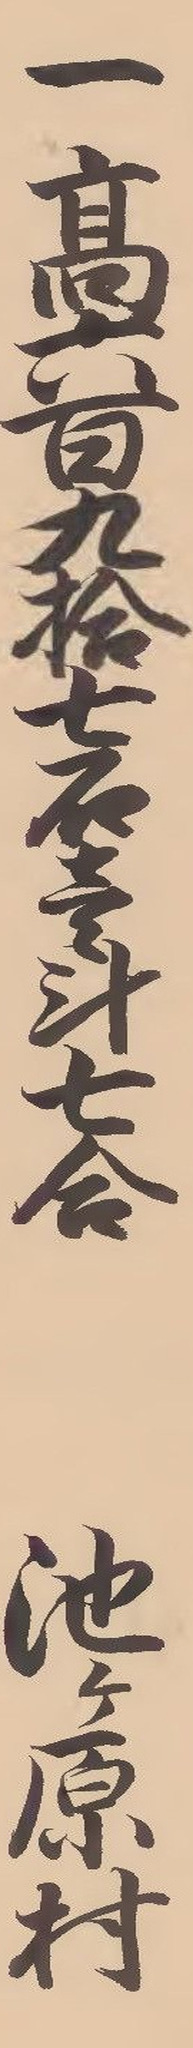一高六百九拾七石壱斗七合池ヶ原村

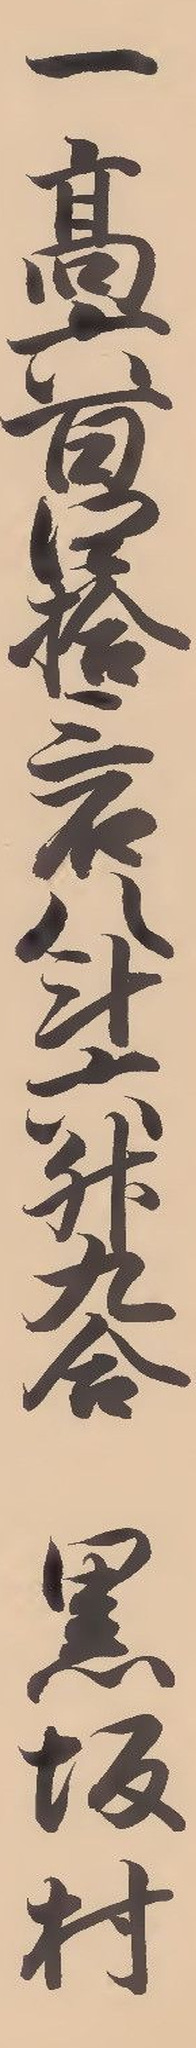一高六百四拾三石八斗六升九合黒坂村
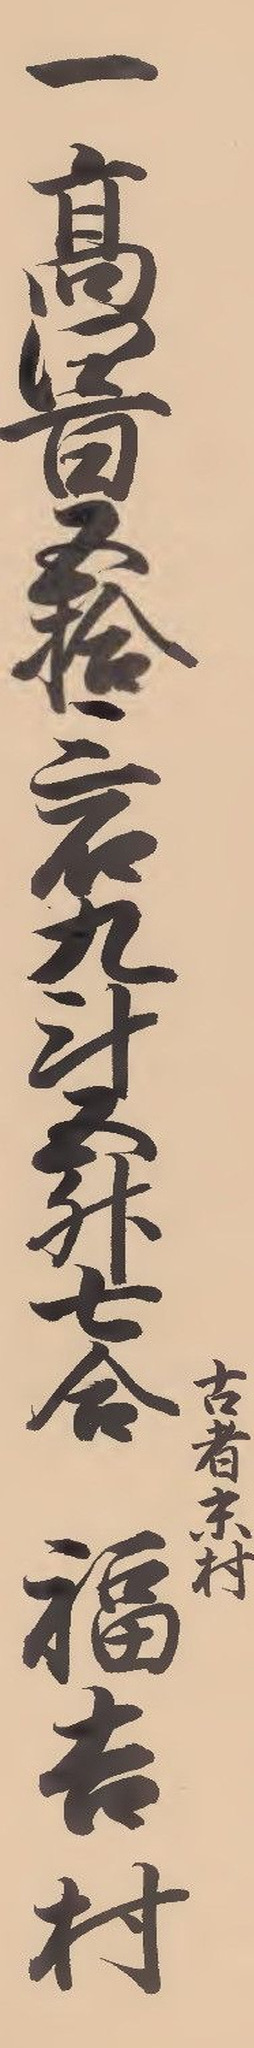一高百五拾三石九斗五升六合馬伏村
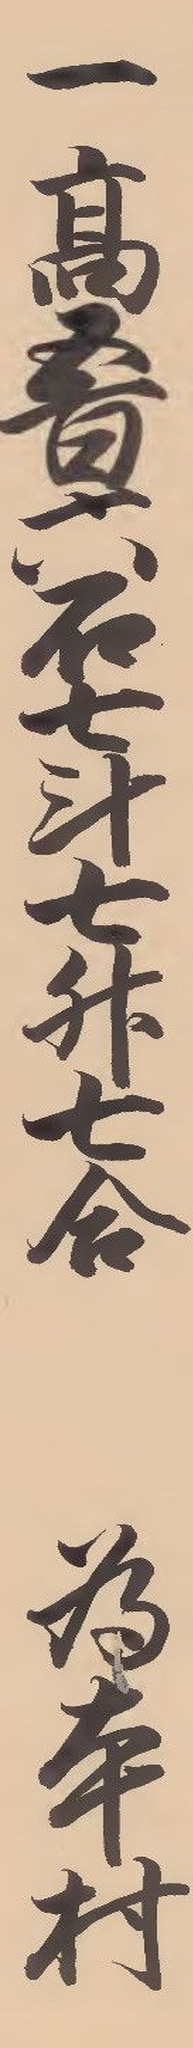一高五百六石七斗七升七合為本村
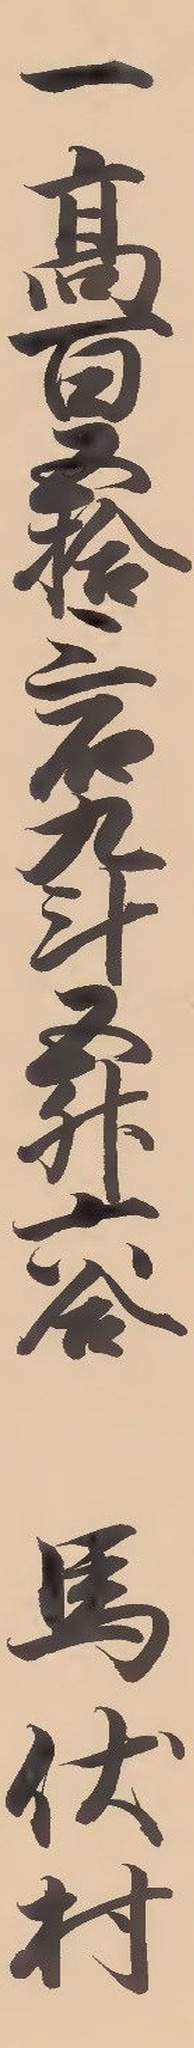一高百五拾三石九斗五升六合馬伏村
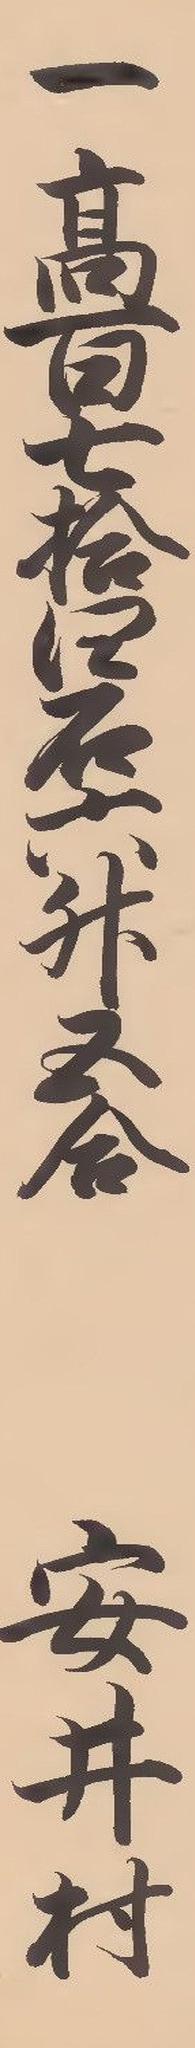一高百七拾四石六升五合安井村
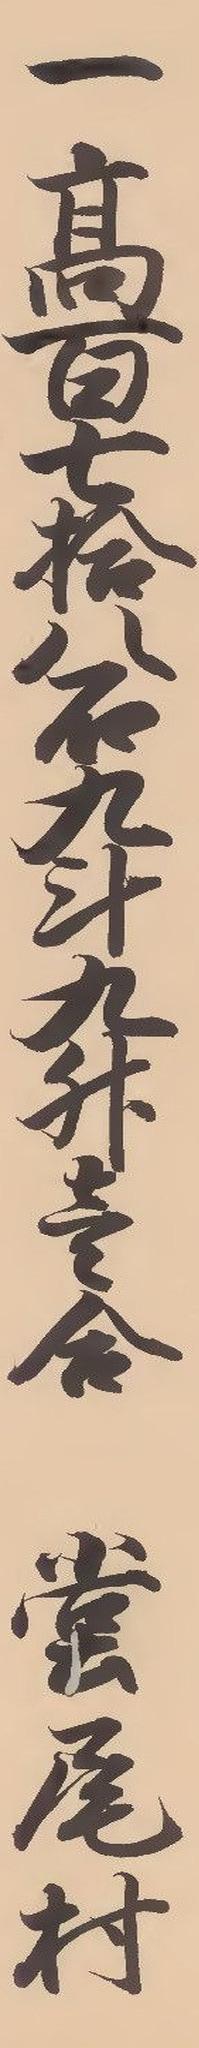一高百七拾八石九斗九升壱合堂尾村
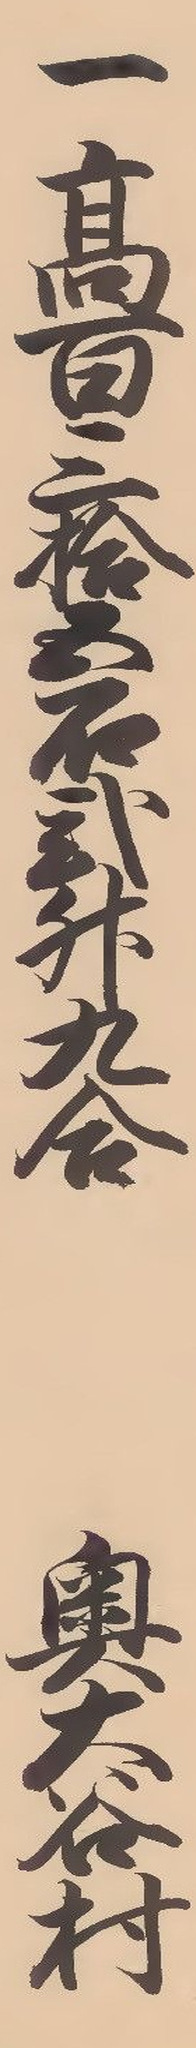一高百三拾五石弐升九合奥大谷村
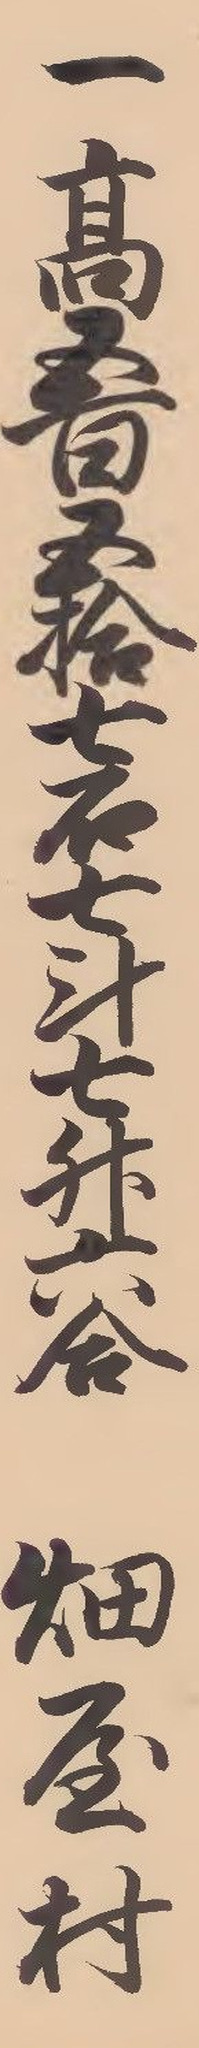一高五百五拾七石七斗七升六合畑屋村

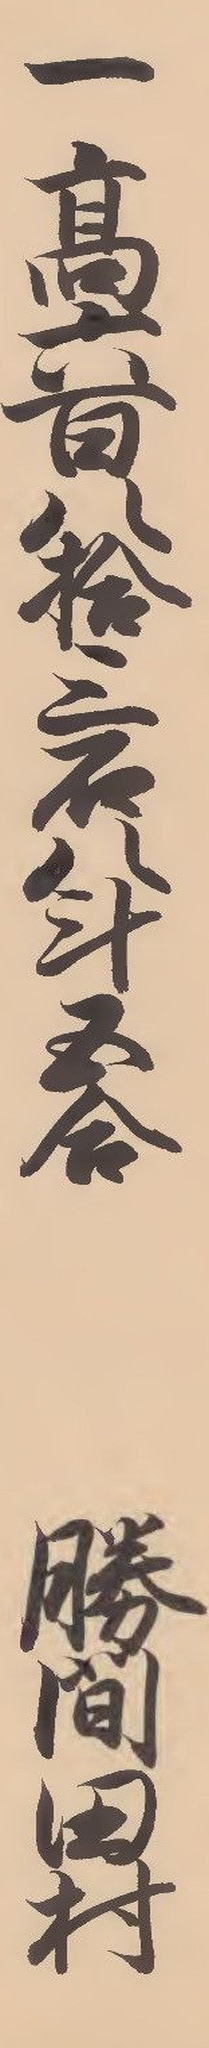一高六百八拾三石八斗五合勝間田村
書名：美作国郷帳
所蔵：国立公文書館 National Archives of Japan
